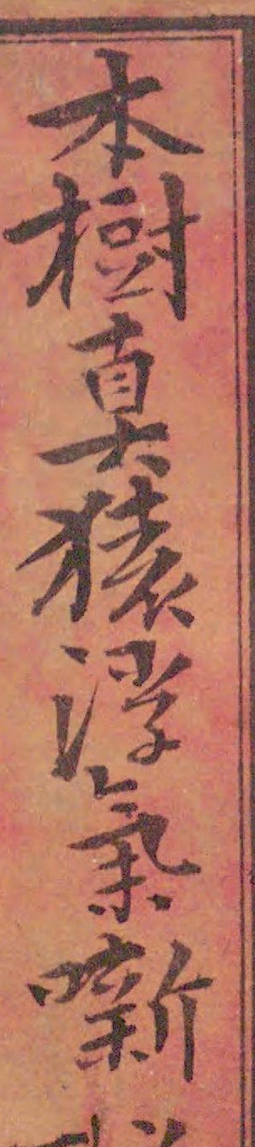本樹真猿浮気噺

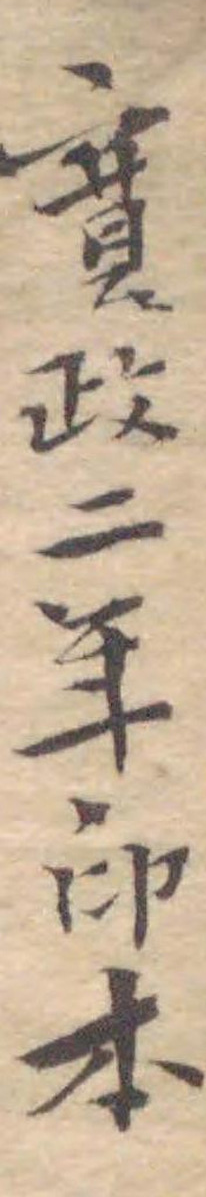寛政二年印本

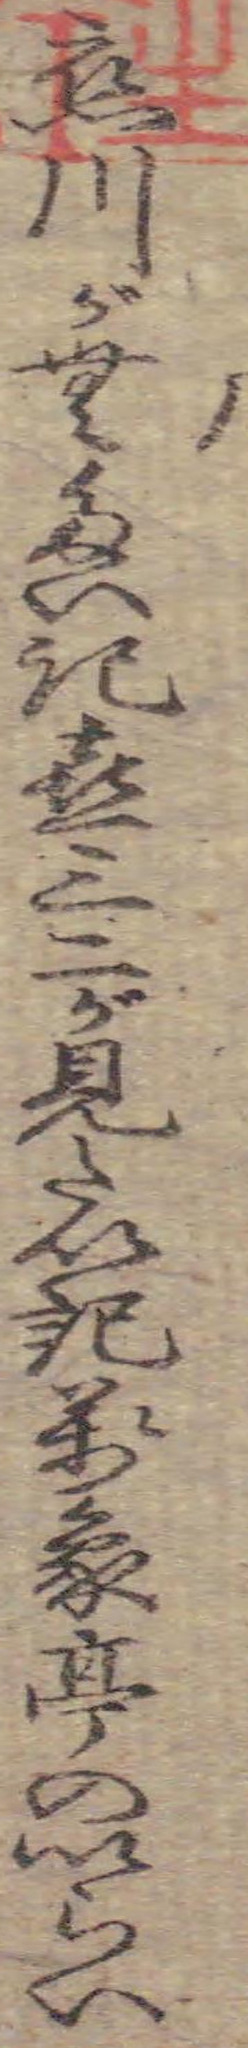恋川がむたい記喜三二が見たい記万象亭のいらい
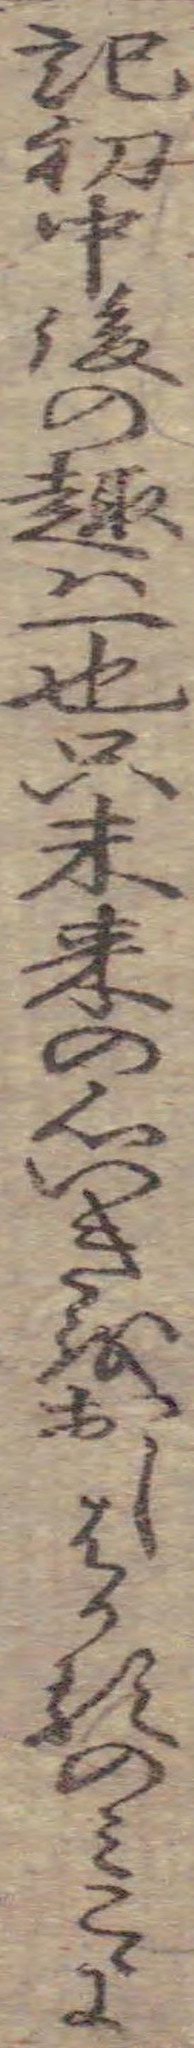記初中後の趣は一也只未来の心いきをおしはかるのみこゝに
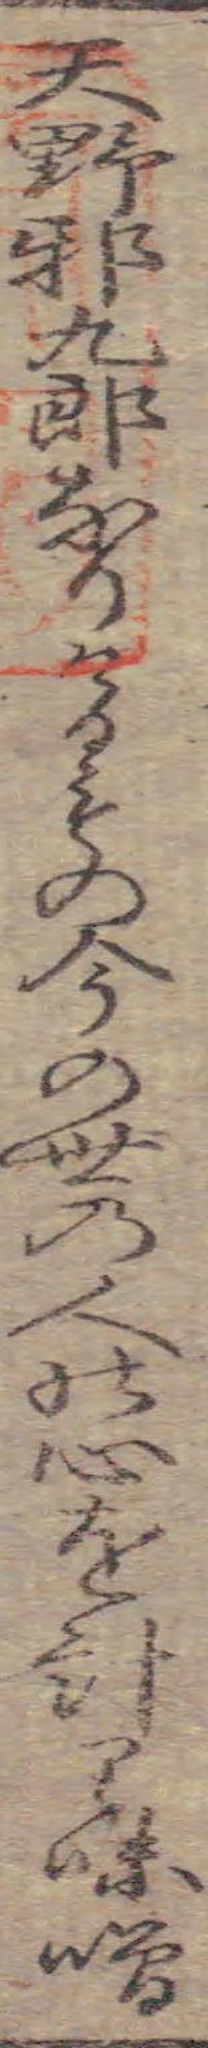天野邪九郎なりけるもの今の世の人の心を計り味噌
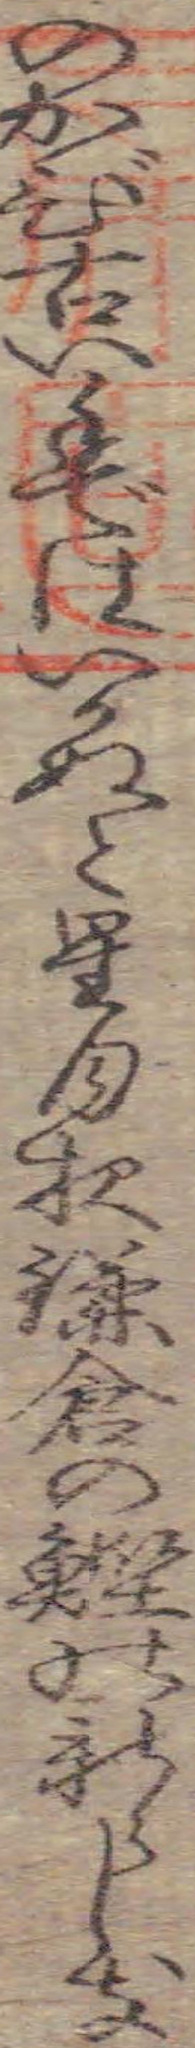のかび古い手ではいかぬと星月夜鎌倉の鯉の新らしき
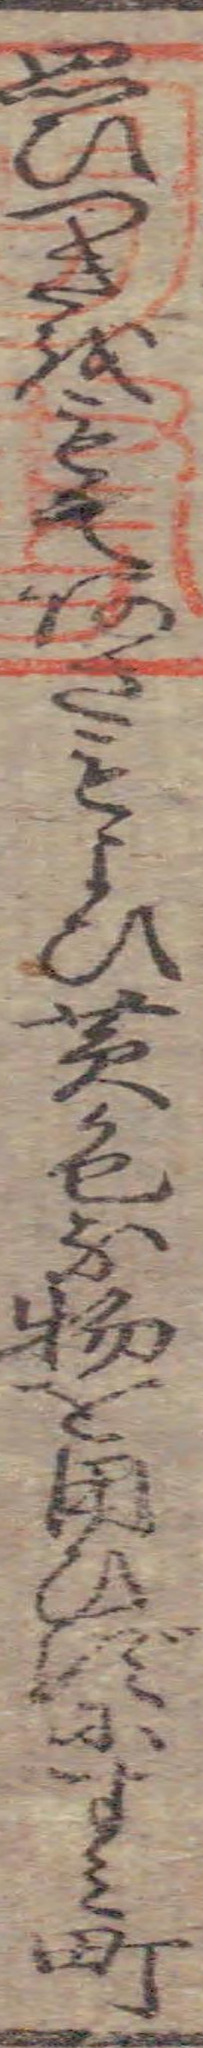思ひつきをもてあさもよひ黄色な物を用ひずにすみ町
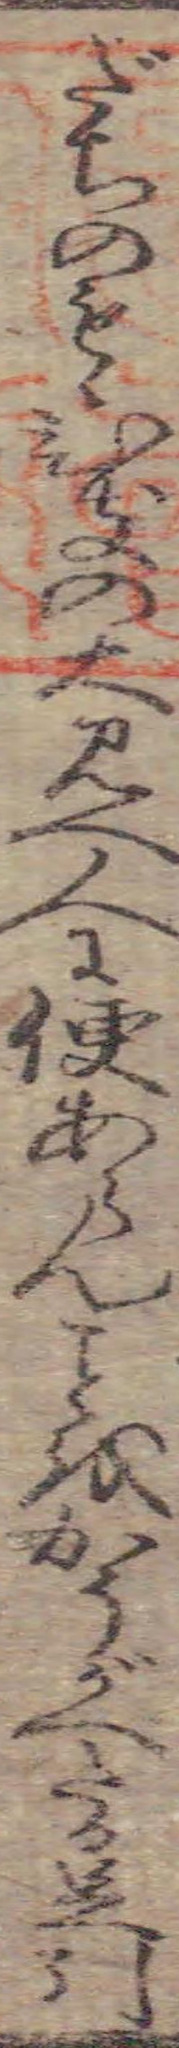だちのもゝひきの大見へ人に便あらんことをかうがへたる足引
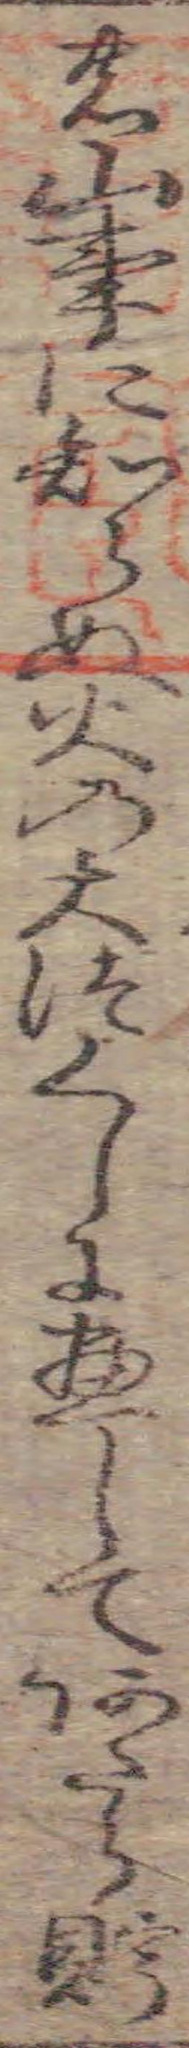の山事に知らぬ火の大つくしに惣してあたら貯
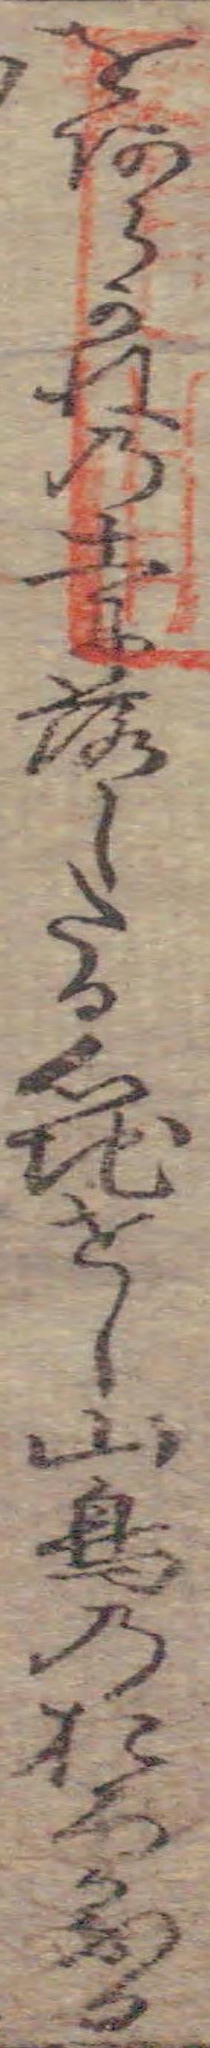をあらかねの土に落したる心地せし山鳥のおろかなる
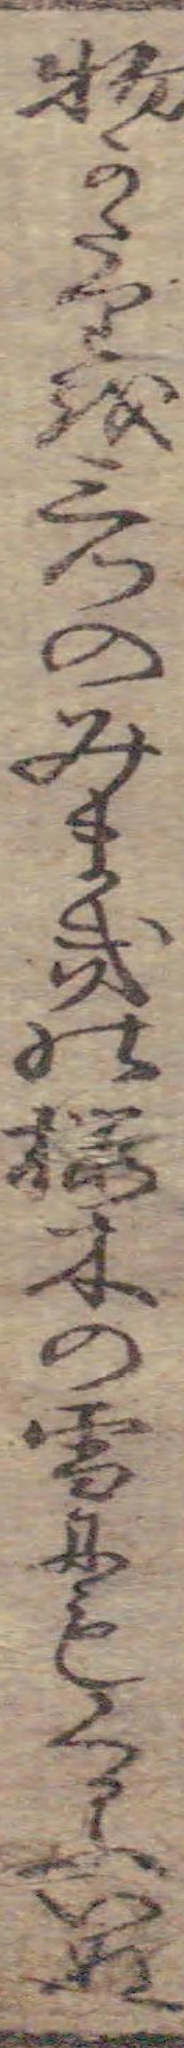物かたりを三つのみまきの桜木の雪にもくるふいぬ
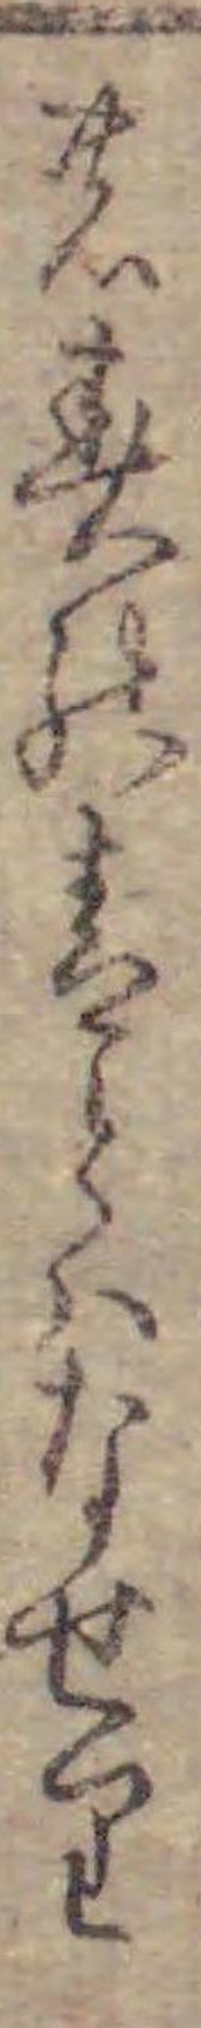の春の青とはなせり
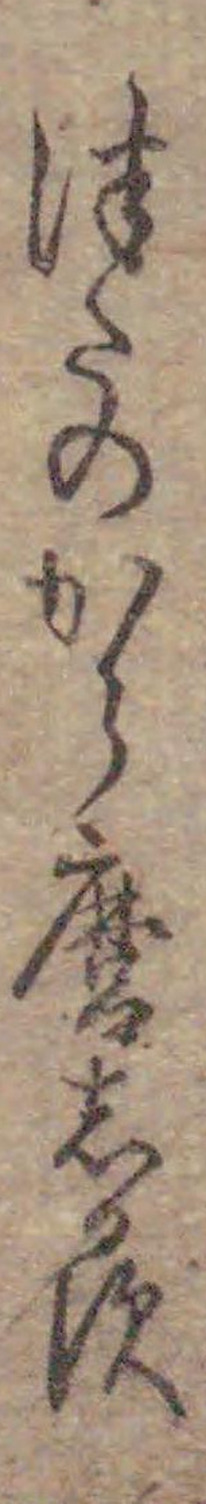つたのから麿しるす

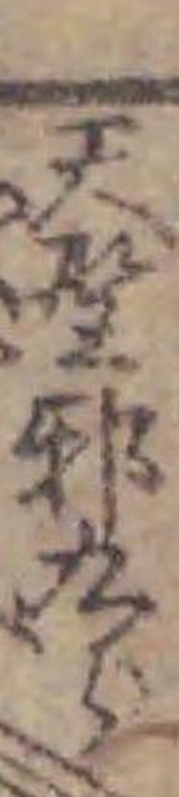天野邪九郎
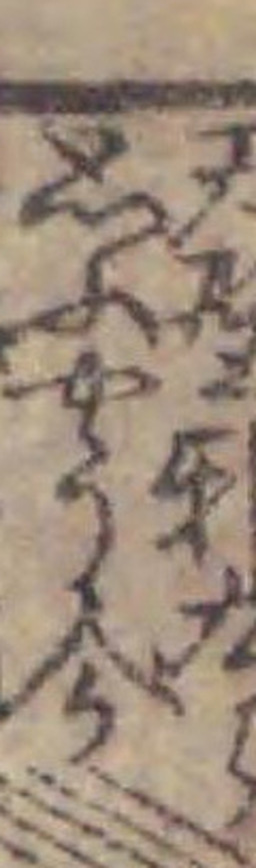思ふやう今
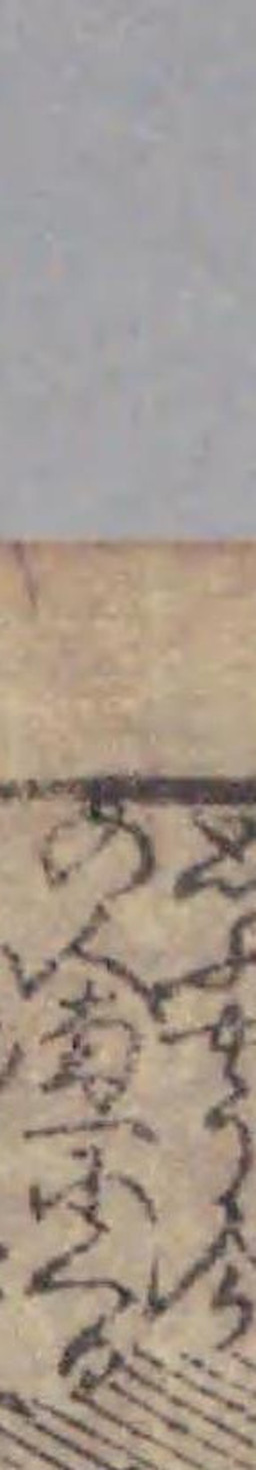の人両一にくる
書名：本樹真猿浮気噺 : 3巻
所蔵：国立国会図書館 National Diet Library, JAPAN
